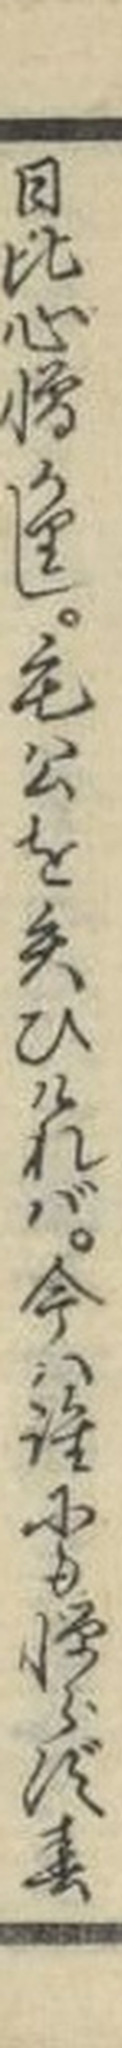日比心憎かりし。毛公を失ひければ。今は誰にも憚らず春
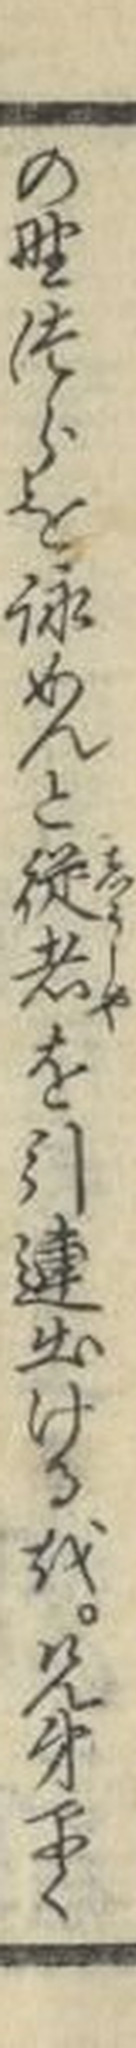の野つらを詠めんと従者を引連出けるを。兄弟早く
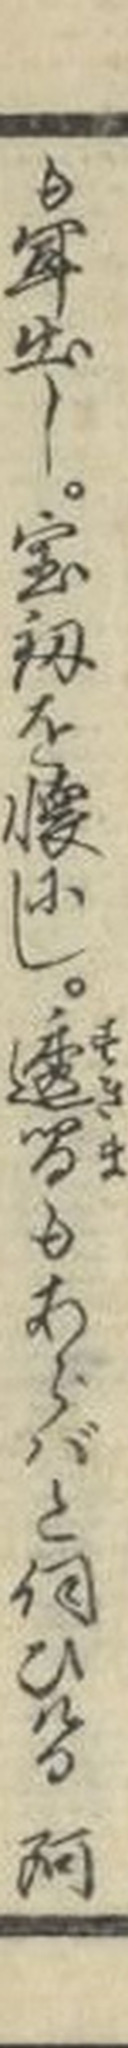も聞出し。宝剣を懐にし。透間もあらばと伺ひける阿
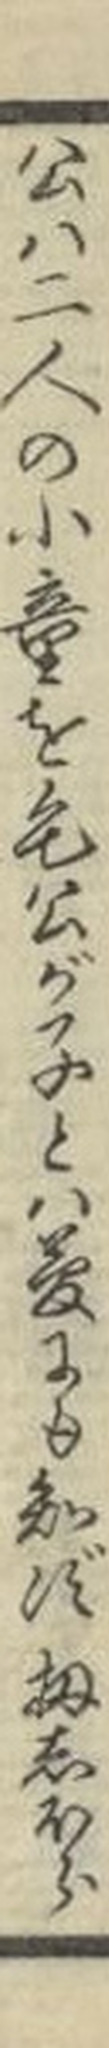公は二人の小童を毛公が子とは夢にも知ず扨しほら
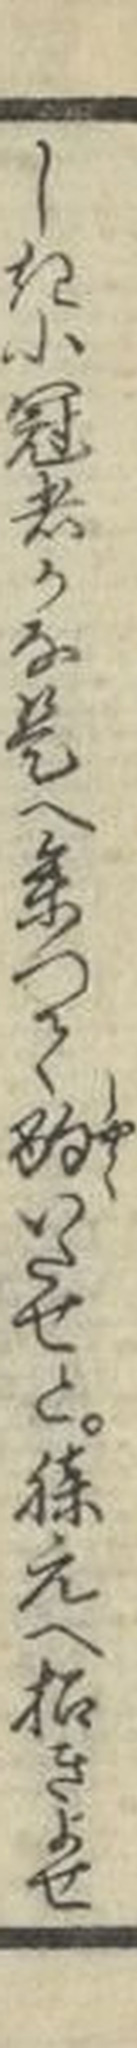しき小冠者かな是へ参つて酌いたせと。膝元へ招きよせ
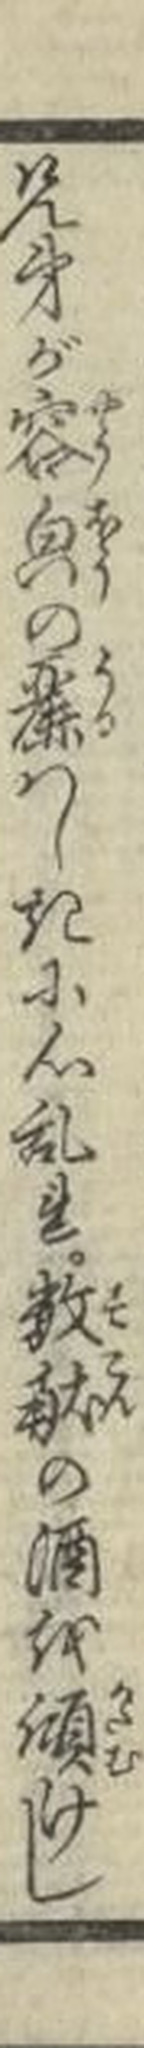兄弟が容貌の麗はしきに心乱れ。数献の酒を傾けし
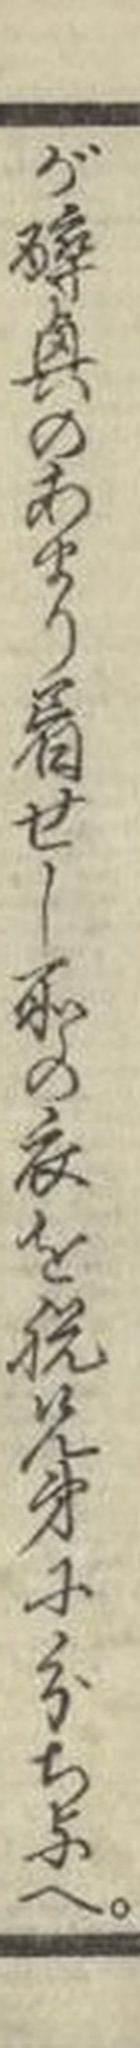が酔興のあまり着せし所の衣を脱兄弟に分ち与へ。
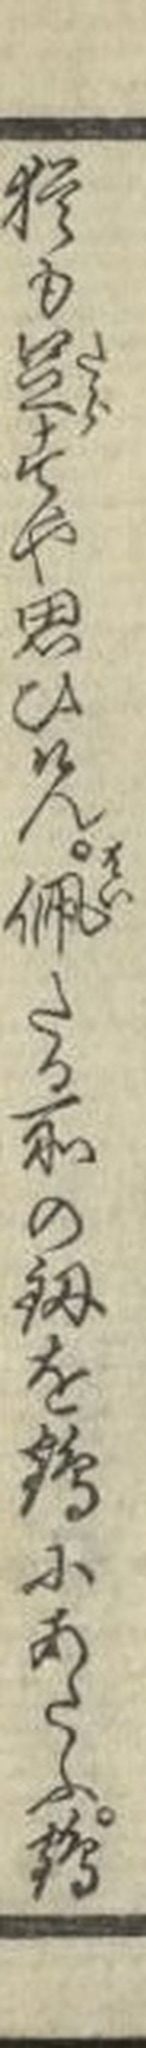猶も足すや思ひけん。佩たる所の剣を鶴にあたふ。鶴
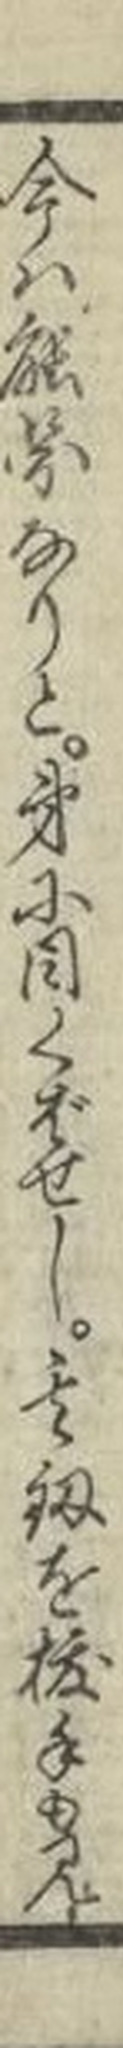今は能図なりと。弟に目くばせし。其剣を抜手も見
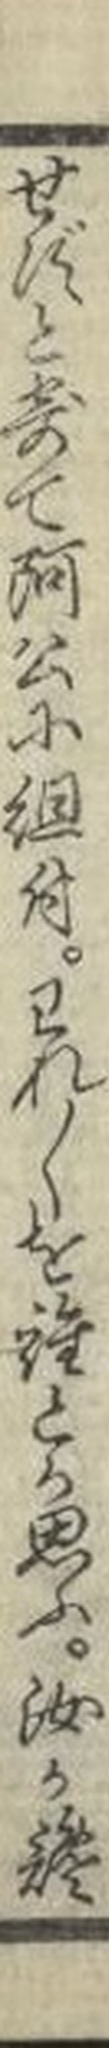せずと寄て阿公に組付。われ〳〵を誰とか思ふ。汝が讒
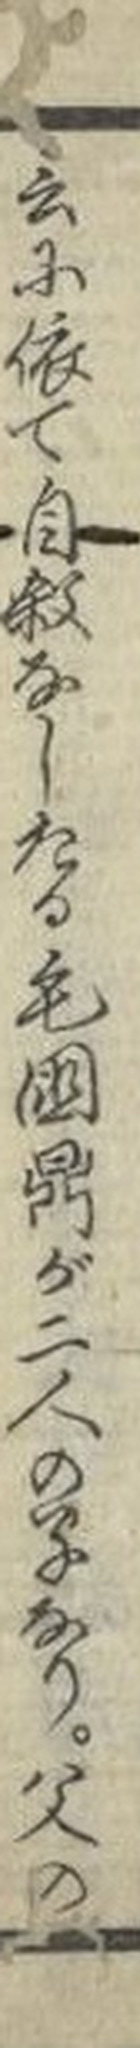言に依て自殺なしたる毛国鼎が二人の子なり。父の

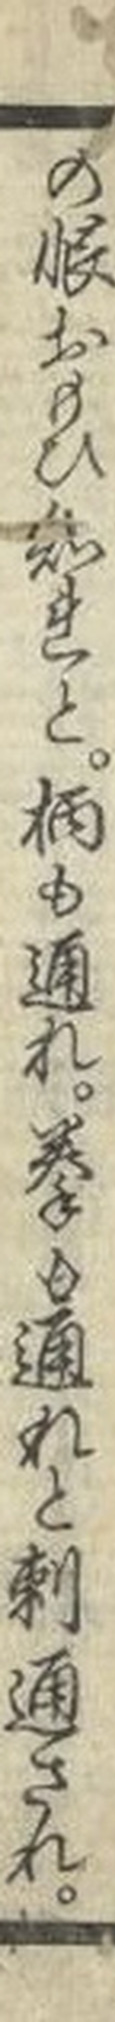の恨おもひ知れと。柄も通れ。拳も通れと刺通され。
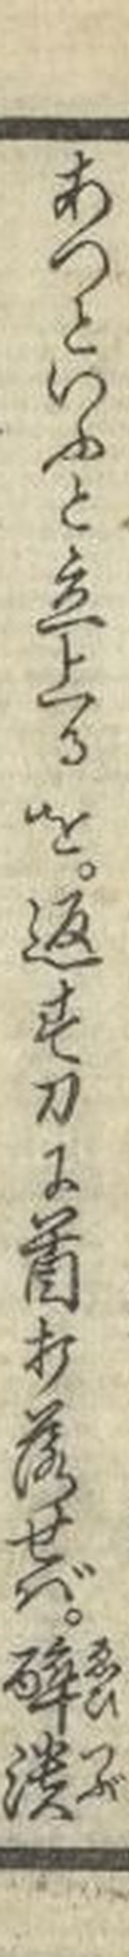あつといふと立上るを。返す刀に首打落せば。酔潰
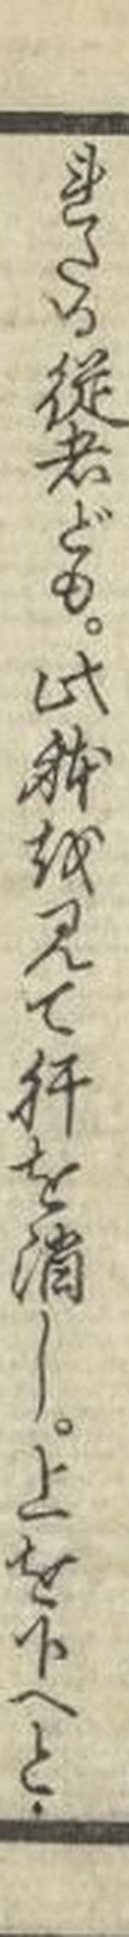れたる従者ども。此体を見て肝を消し。上を下へと
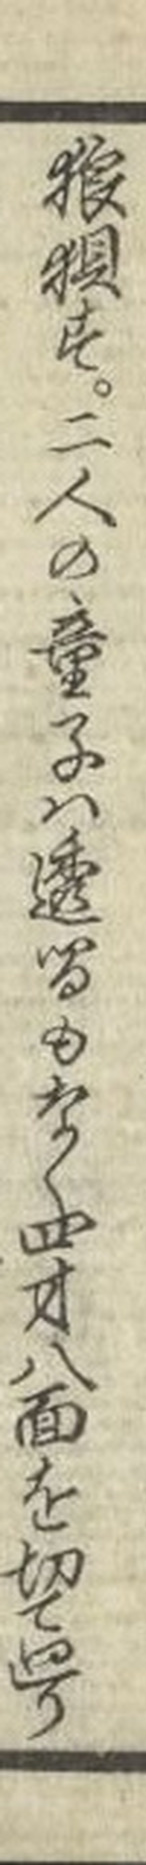狼狽す。二人の童子は透間もなく四方八面を切て廻り
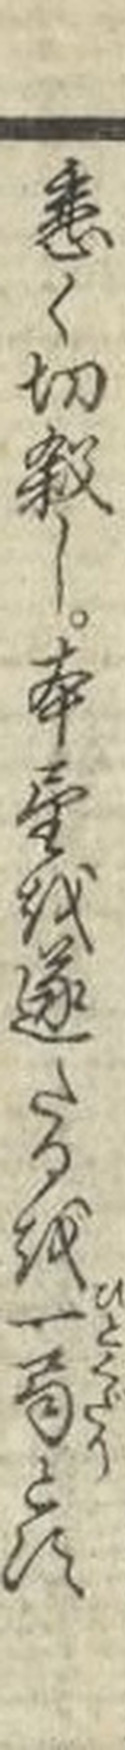悉く切殺し。本望を遂たるを一局とす
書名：琉球解語
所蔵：University of the Ryukyus Library
